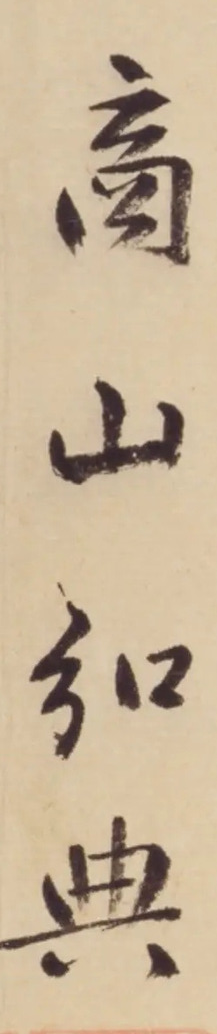商山和典
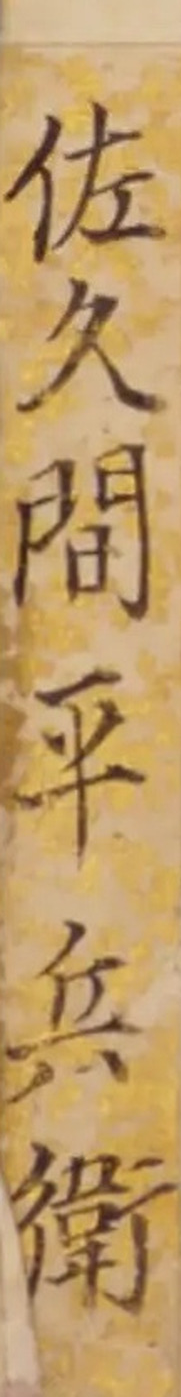佐久間平兵衛

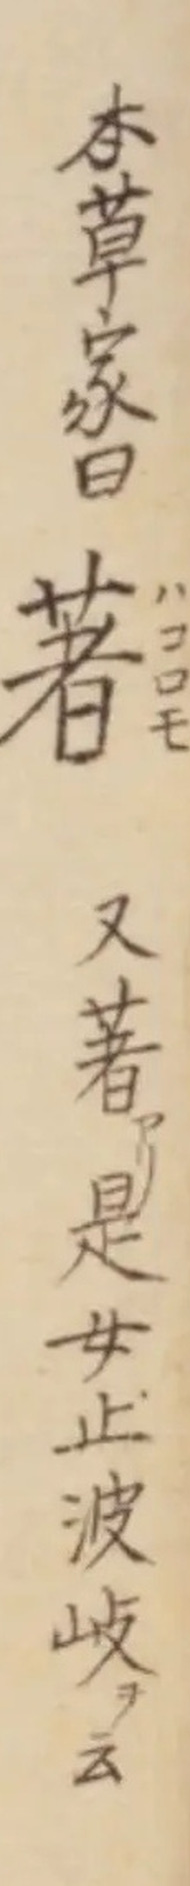本草家著又著アリ是女止波岐ヲ云
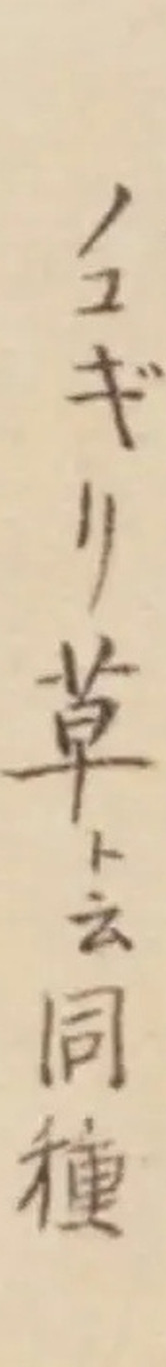ノコギリ草ト云同種
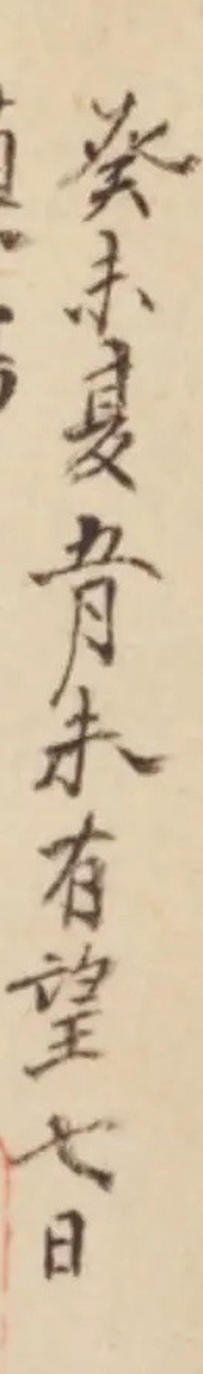癸未夏五月未有望七日
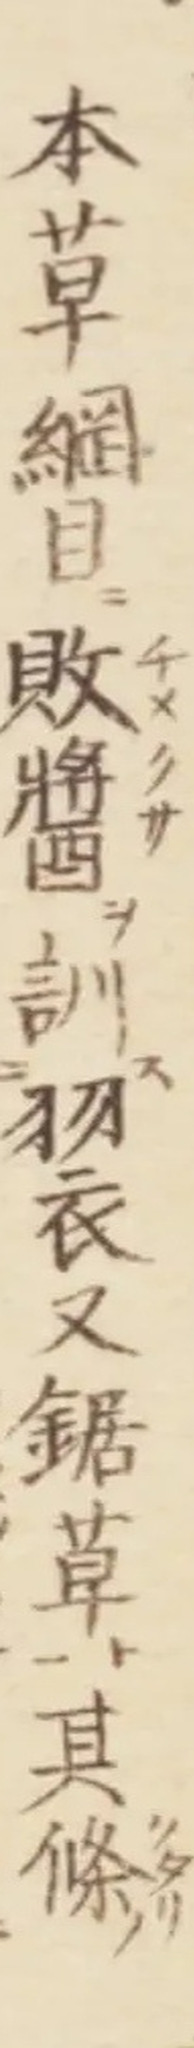本草綱目ニ敗醤ヲ訓ス羽衣又鋸草ト其條ノ
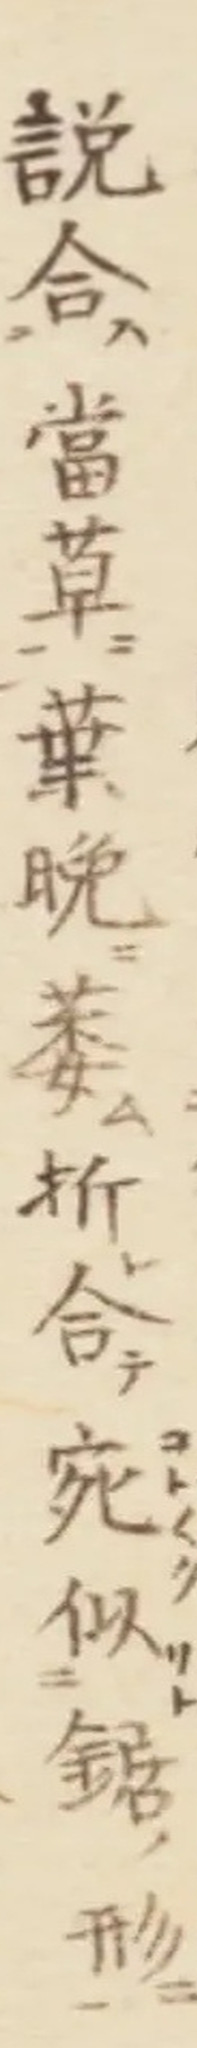説合ハ當草ニ葉晩ニ萎ム折レ合テ宛似リト鋸ノ形ニ
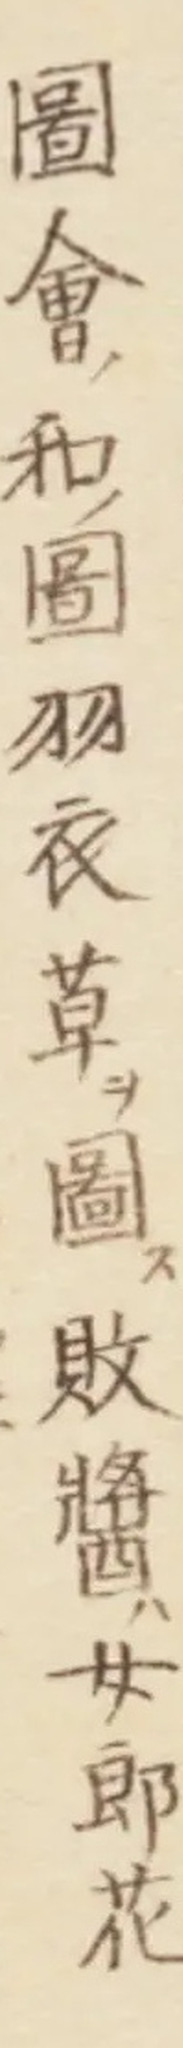圖會ノ和ノ圖會羽衣草ヲ圖ス敗醤ハ女郎花
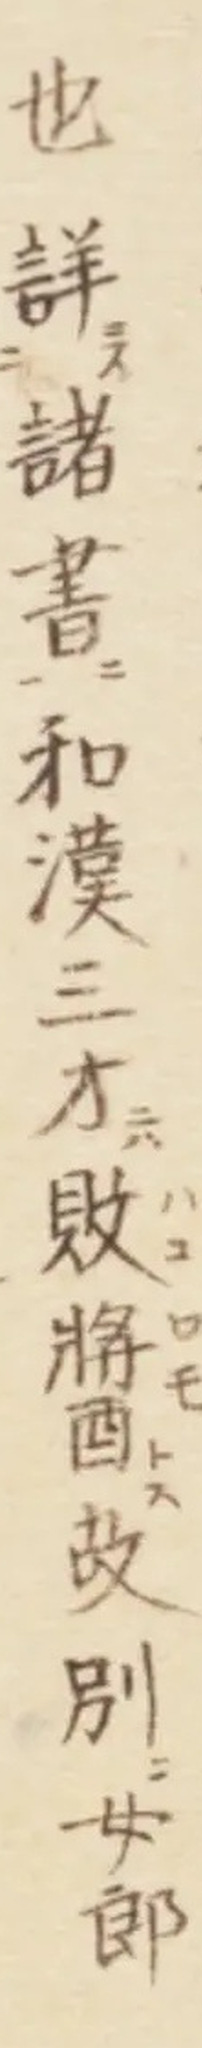也詳ニス諸書ニ和漢三才ハ敗醤トス故別ニ女郎
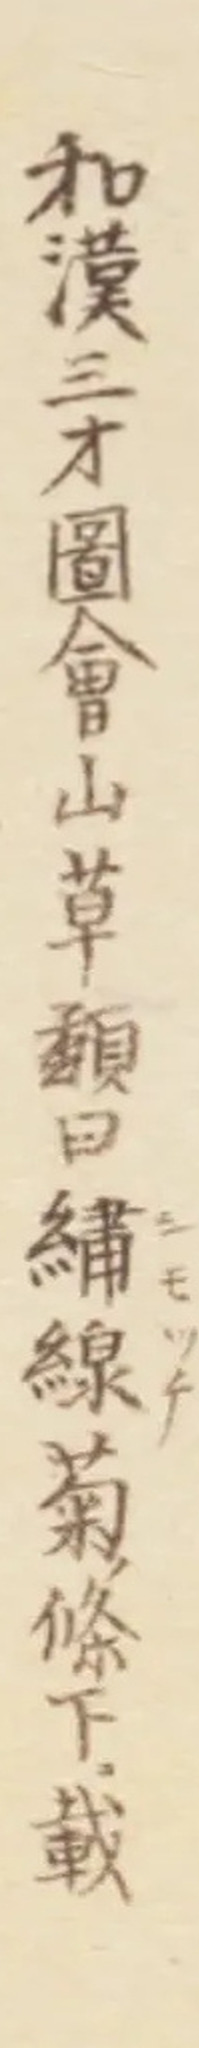和漢三才圖會山草類ニ曰繍線菊ノ條下ニ載
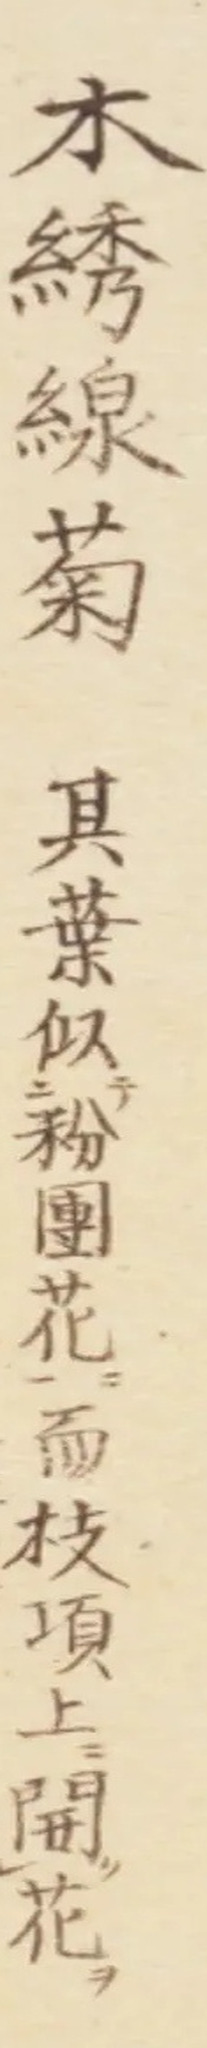木綉線菊其葉似テ粉團花ニ而枝項上ニ開ク花ヲ
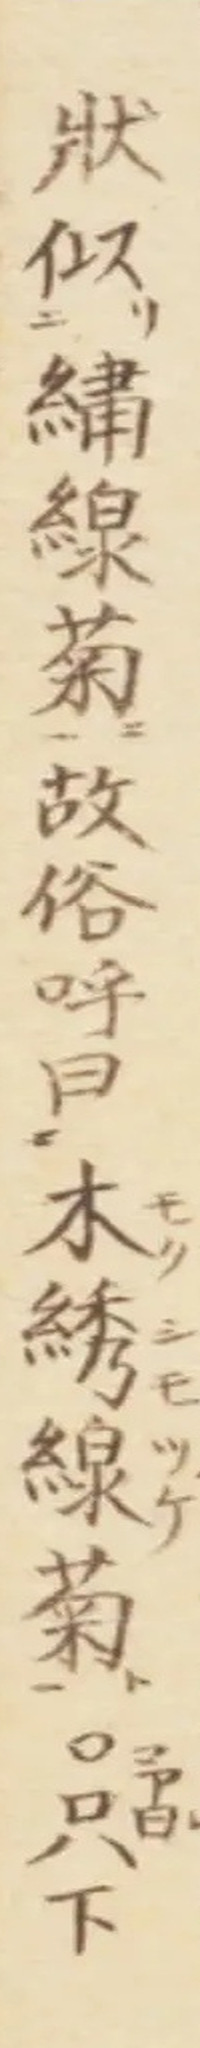状似リ刺繍線菊ニ故族呼曰木綉線菊ト〇只下
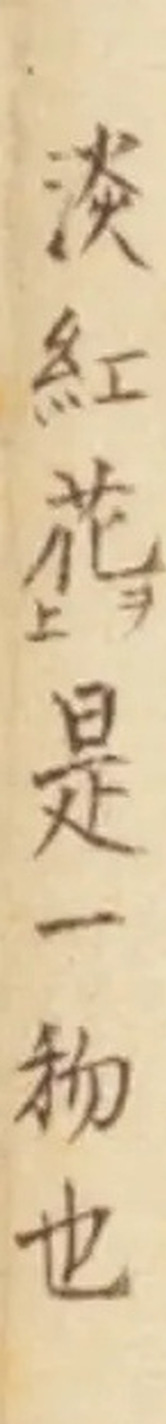淡紅花を是一物ル
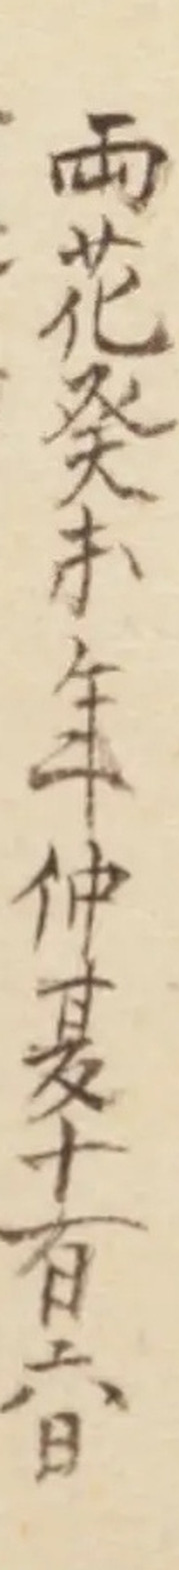両花癸未年仲夏十有六日

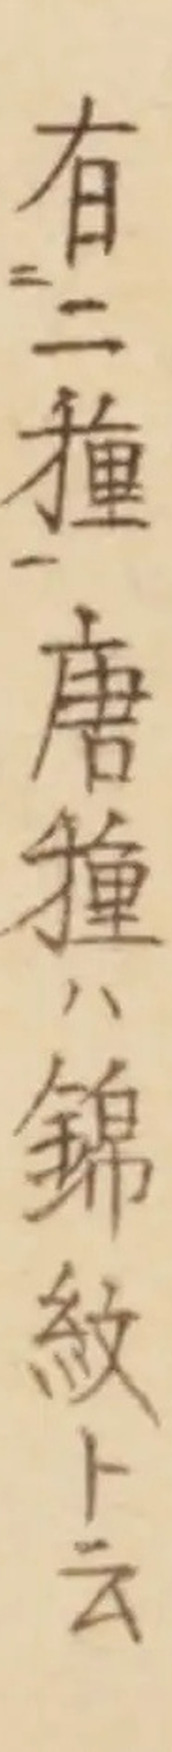大黄有二種唐種ハ錦紋ト云
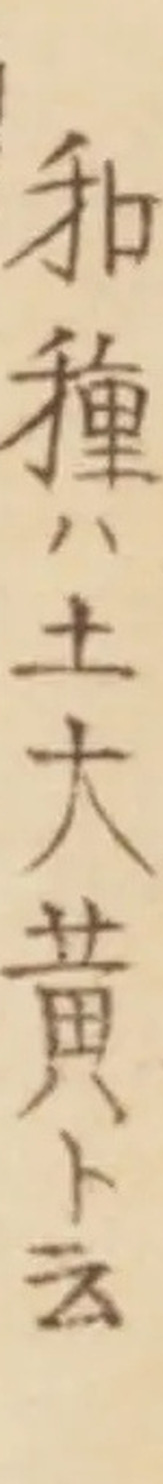和種ハ大黄ト云
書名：梅園草木花譜夏之部. 2
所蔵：国立国会図書館 National Diet Library, JAPAN
